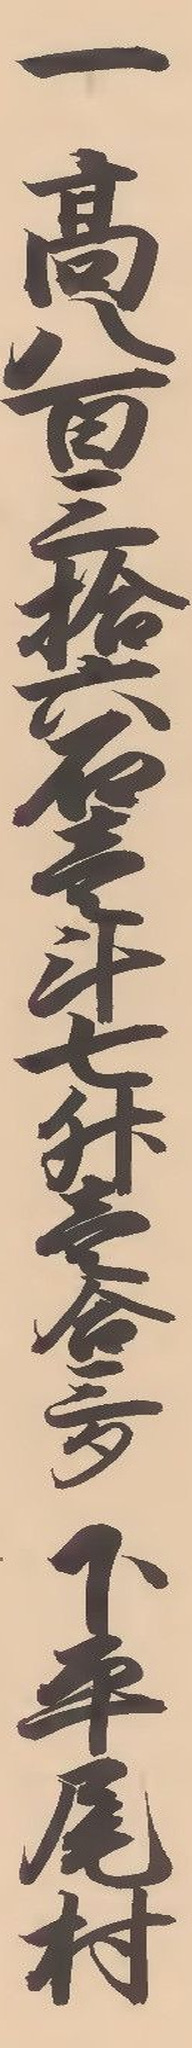一高八百三拾六石壱斗七升壱合三勺下平尾村
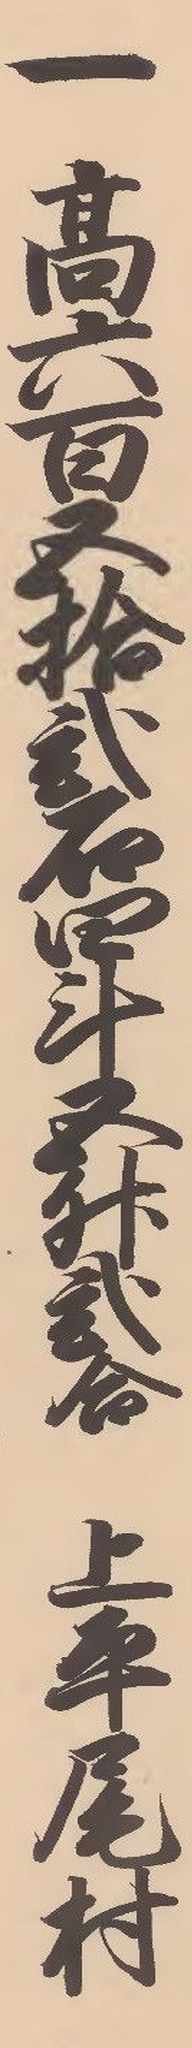一高六百五拾弐石四斗五升弐合上平尾村
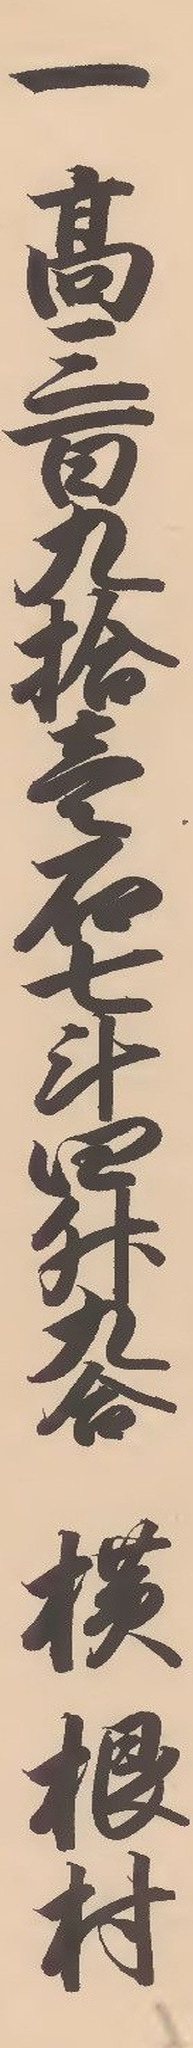一高三百九拾壱石七斗四升九合横根村
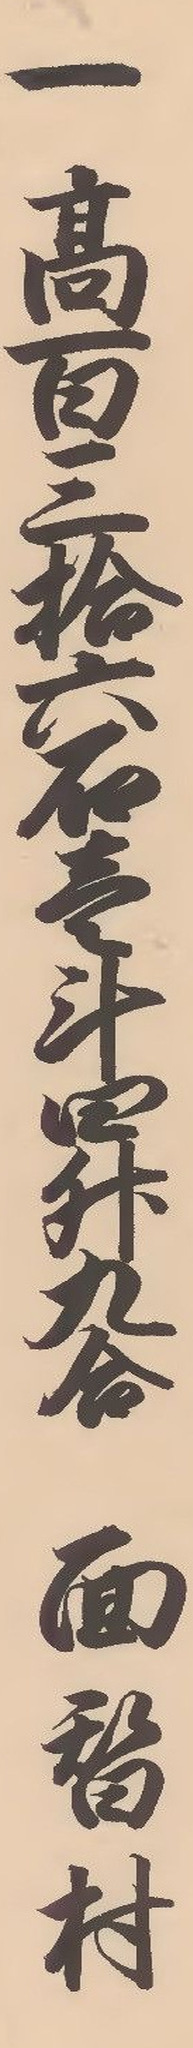一高百三拾六石壱斗四升九合面替村
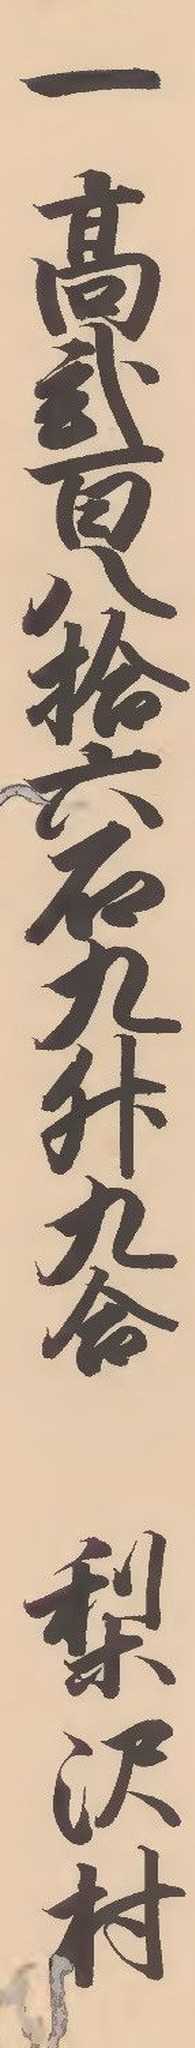一高弐百八拾六石九升九合梨沢村

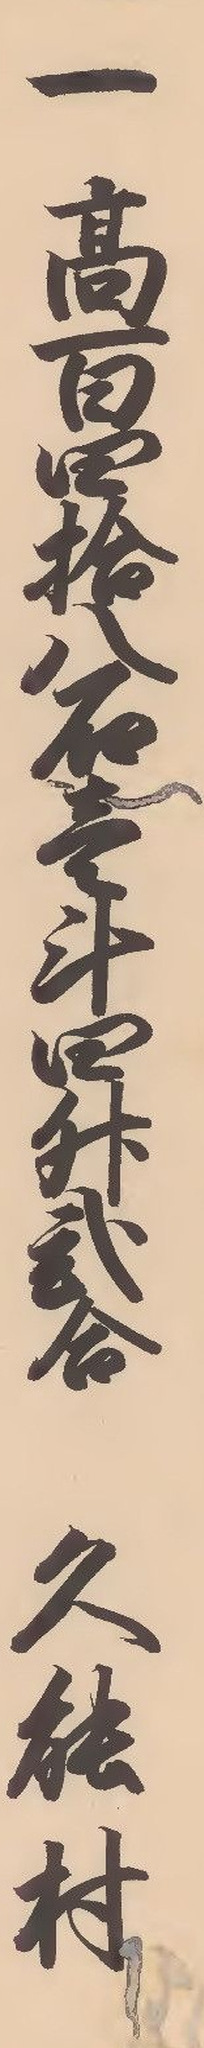一高百四拾八石壱斗四升弐合久能村
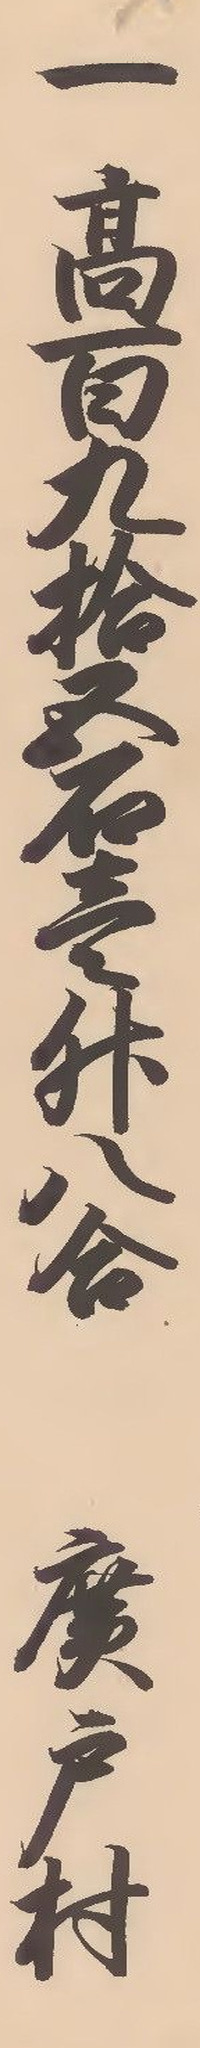一高百九拾五石壱升八合広戸村
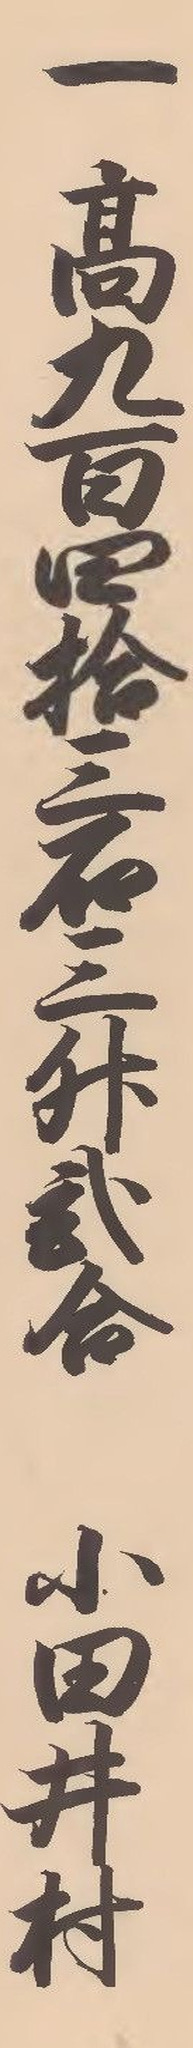一高九百四拾三石三升弐合小田井村
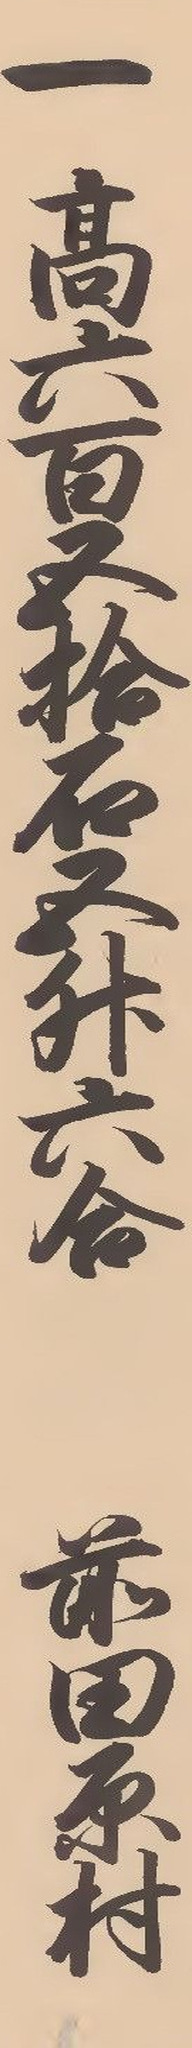一高六百五拾石五升六合前田原村
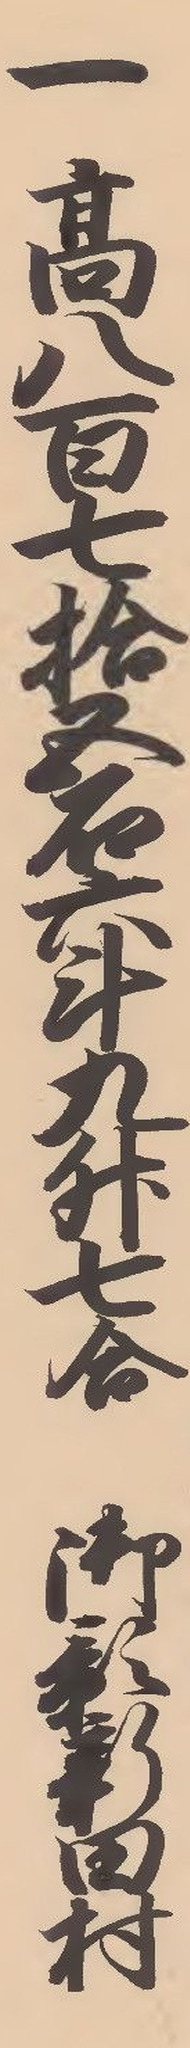一高八百七拾五石六斗九升七合御影新田村
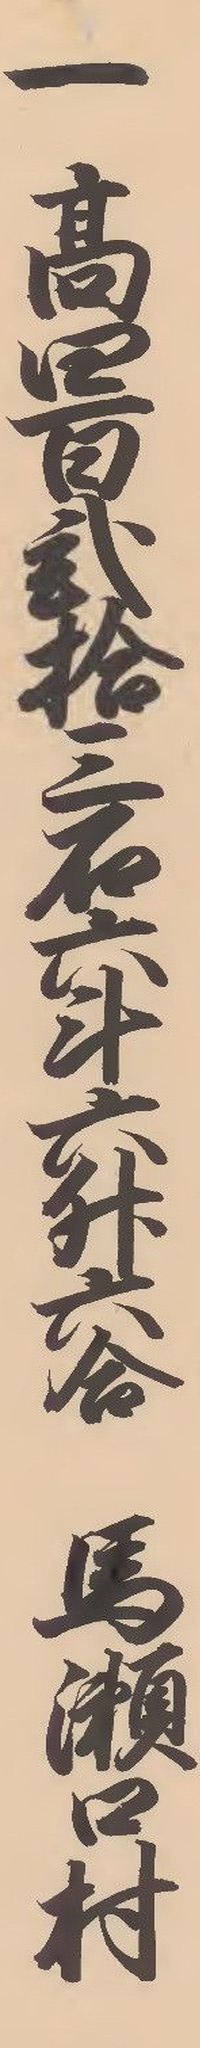一高四百弐拾三石六斗六升六合馬瀬口村
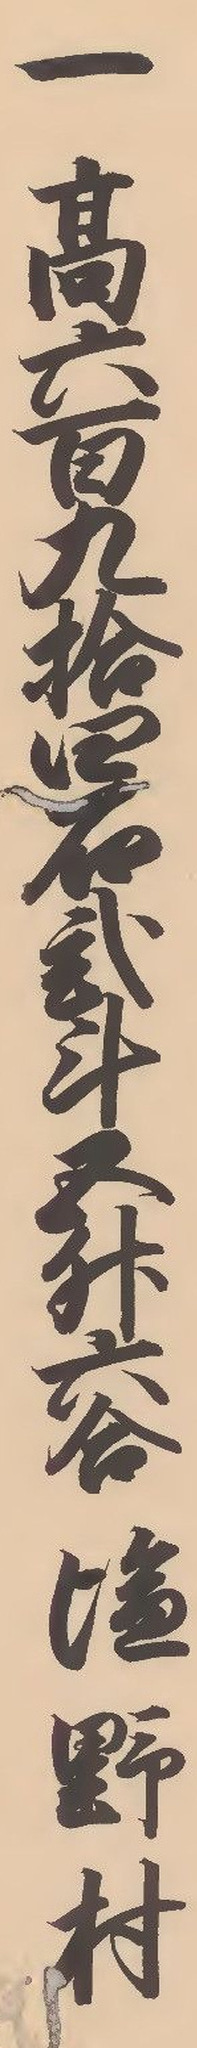一高六百九拾四石弐斗五升六合塩野村

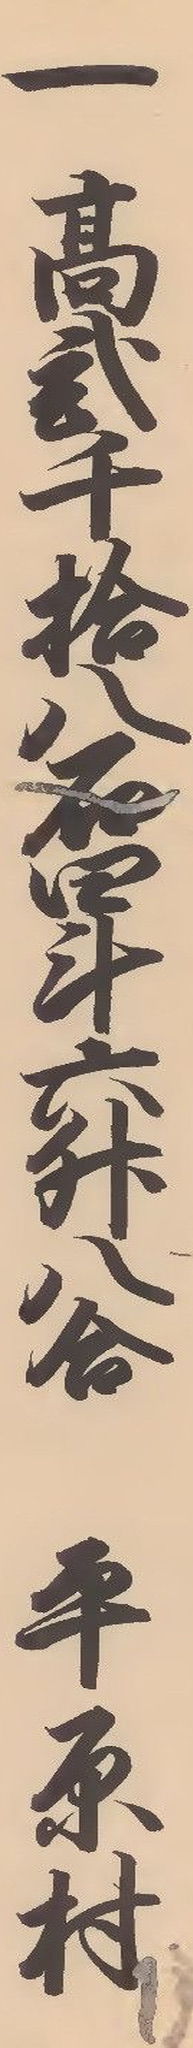一高弐千拾八石四斗六升八合平原村
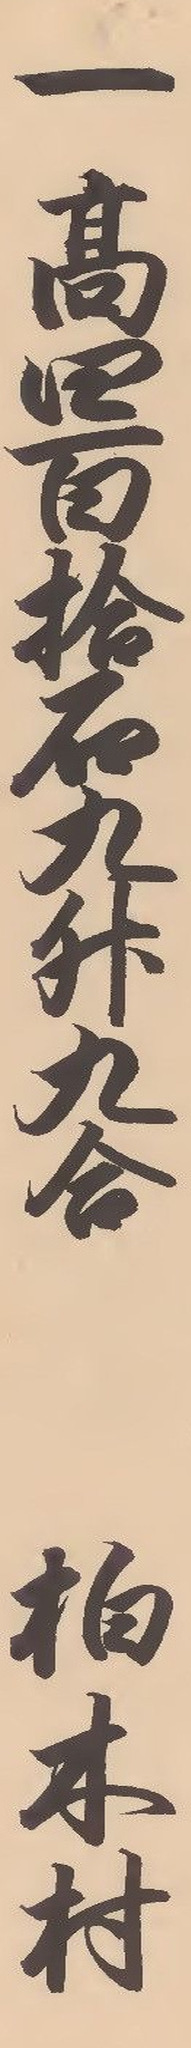一高四百拾石九升九合柏木村
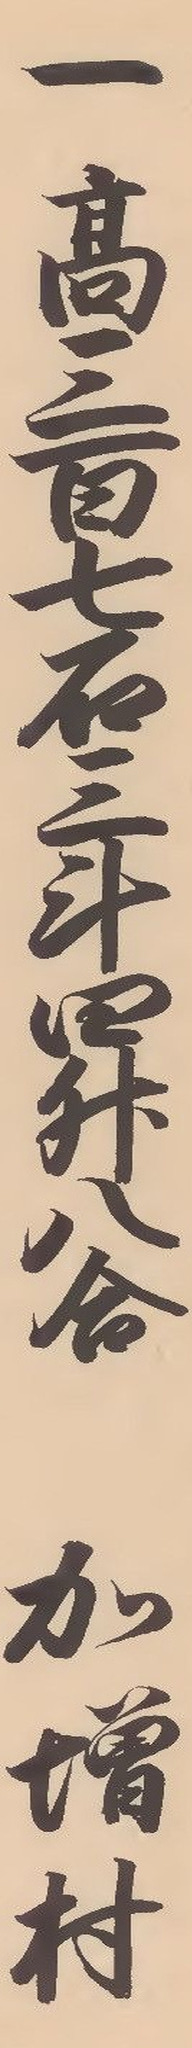一高三百七石三斗四升八合加増村
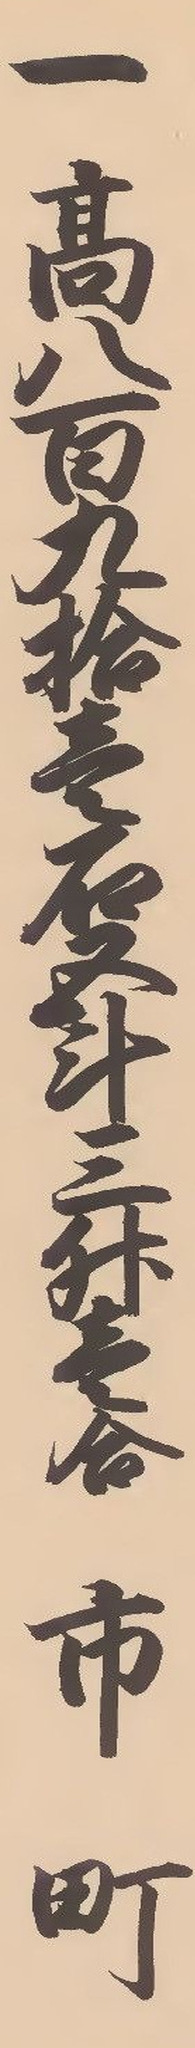一高八百九拾壱石五斗三升壱合市町
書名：信濃国郷帳
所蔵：国立公文書館 National Archives of Japan
